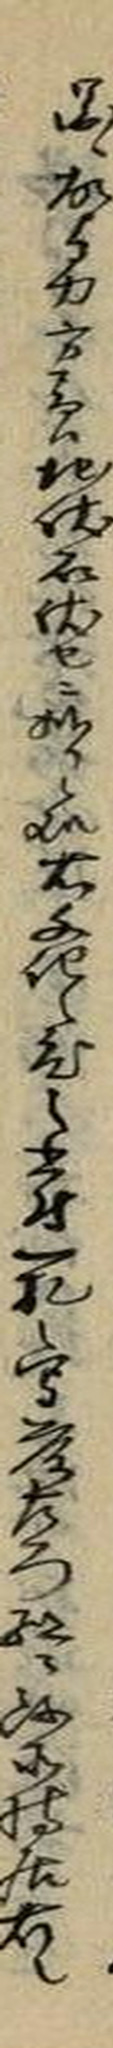図候故与力方にては地伏石伏セに掛り候処右文化之度之書付一札之写藤左衛門組に致所持居右之
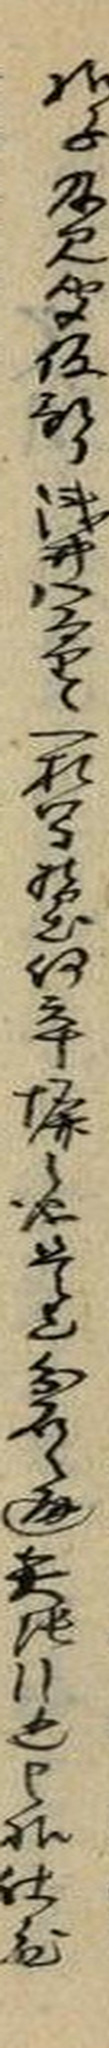様子及見聞仮預り浅井八百里へ一札写指出何卒塀之儀是迄分石之通矢張引込申候様仕度
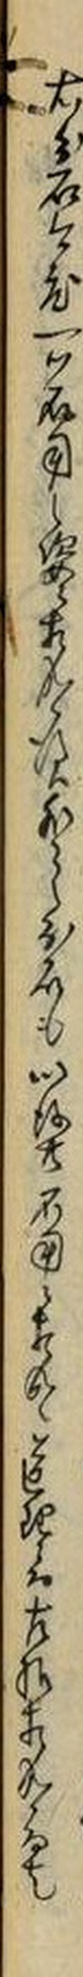右分石今度一ツ不用之姿に相成候得は外之分石も以後共不用に相成候道理にて左様相成候ては
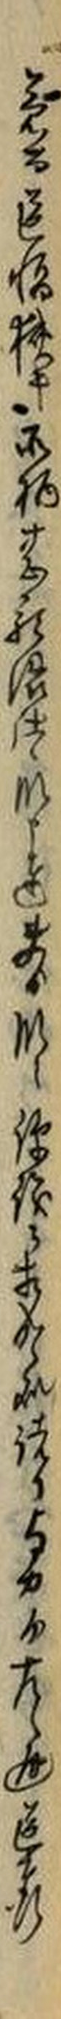兼て道幅狭キ所柄甚難渋仕候段申達夫ゟ段々評議に相成候処詰り与力ゟ左之通道奉行
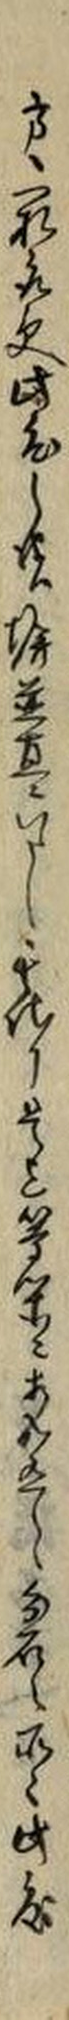方へ一札取受此度之儀は塀並直にいたし其代り是迄等閑に相成有之候分石之所に此度
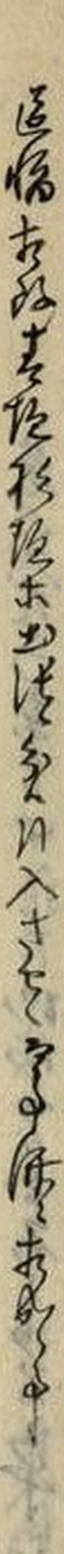道幅相改青垣杉垣等出張候分は引入させ候て事済に相成候事
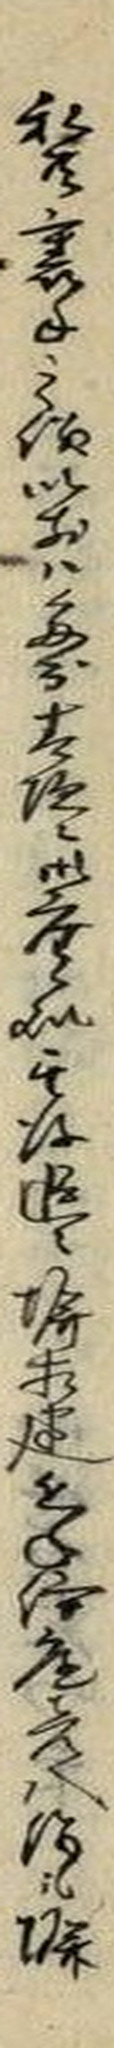私共裏手之儀以前は多分青垣に御座候処其後追々塀相建近年伊庭彦八儀も塀
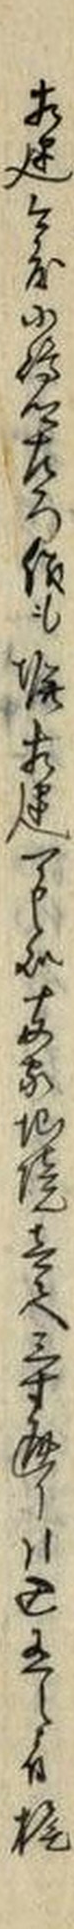相建今度小島郷左衛門儀も塀相建可申候処両家地境壱尺三寸通り引込有之に付梶
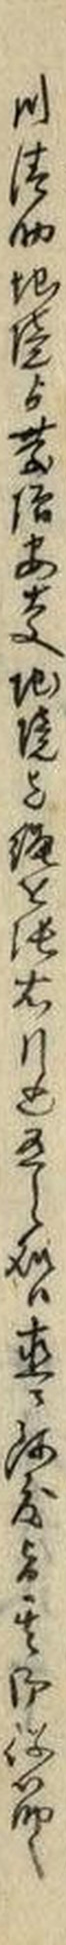川清助地境ゟ慶増安大夫地境迄縄を張右引込有之処は直に致度旨其御役筋へ
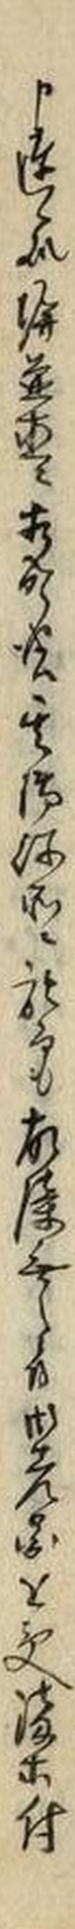申達候処塀並直に相成候儀は其御役所に於ても故障無之に付御差図を受溝等付
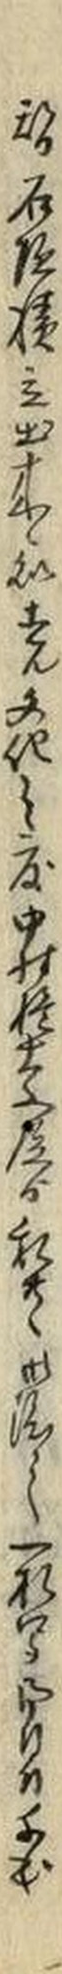替石垣積立出来候処去ル文化之度中村権大夫殿ゟ私共へ御渡之一札写御目付千本
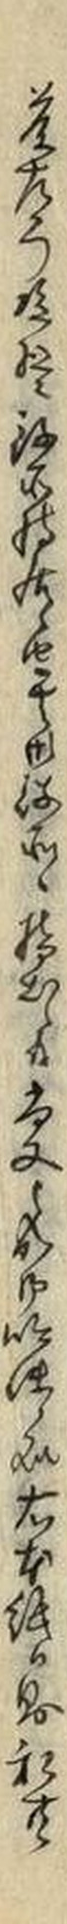藤左衛門殿組に致所持居候由其御役所へ指出候付尚又被成御吟味候処右本紙は則私共
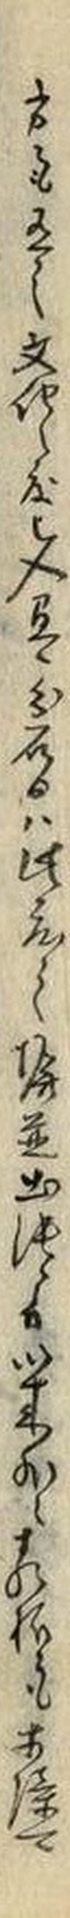方にも有之文化之度被入置候分石ゟは此度之塀並出張候に付以来外の類抔にも相障可
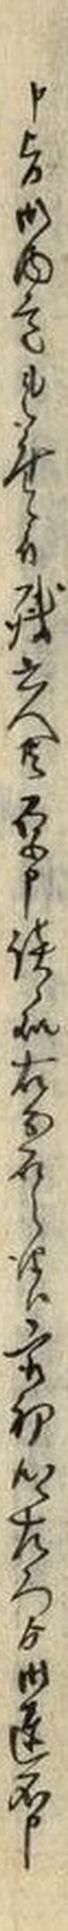申旨御内意も御座候付残六人共厚申談候処右分石之儀は最初郷左衛門ゟ御達不申
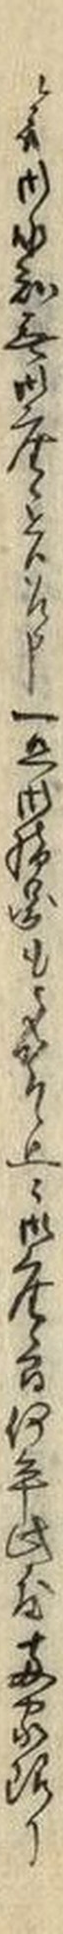候に付御承知無御座候とは乍申一旦御指図も被成下候上に御座候間何卒此度両家限り
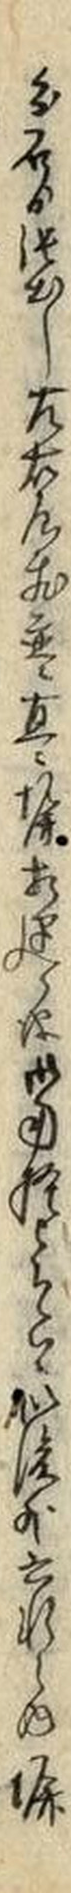分石ゟ張出し左右屋敷並に直に塀相建候儀御用捨被下候はゝ以後外六軒之内塀
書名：御城下諸事之部
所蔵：福井県文書館 Fukui Prefectural Archives
